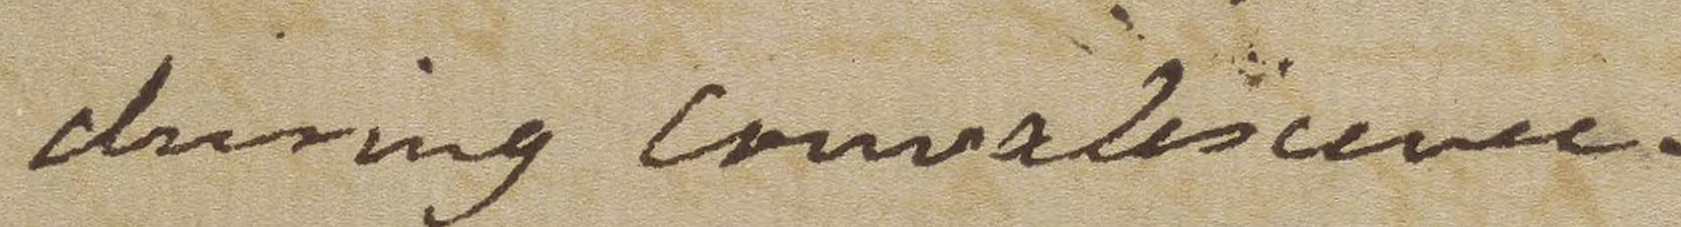during convalescence.
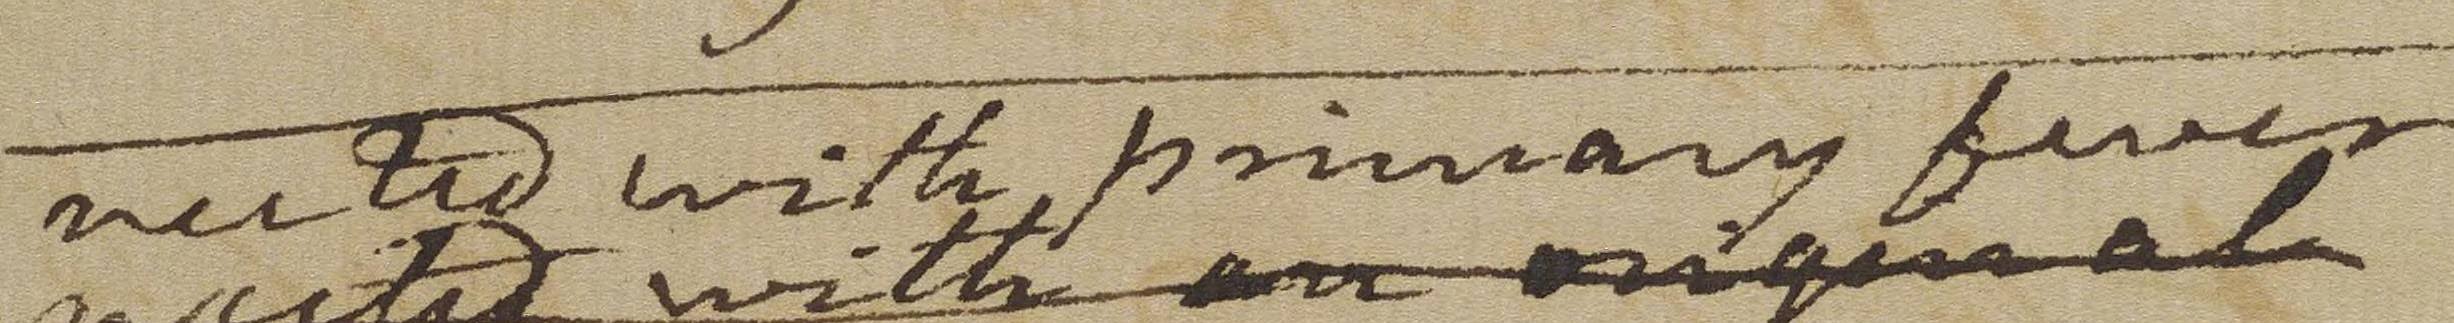-nected with primary fever
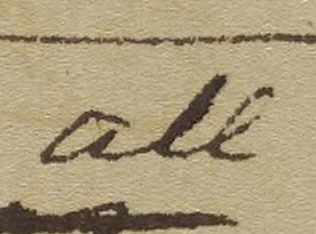all
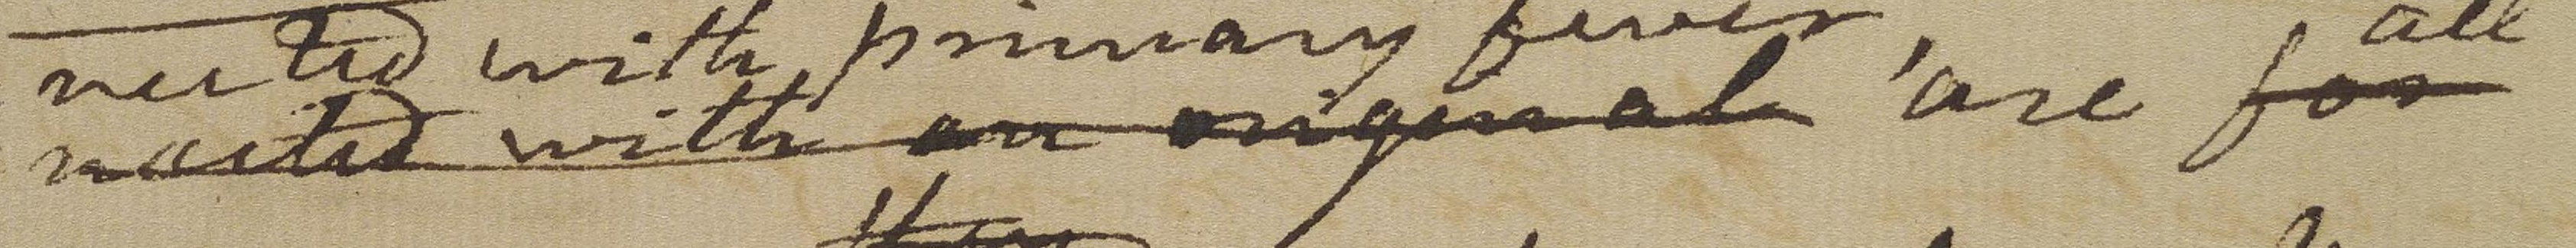[nected with an original] are [for]
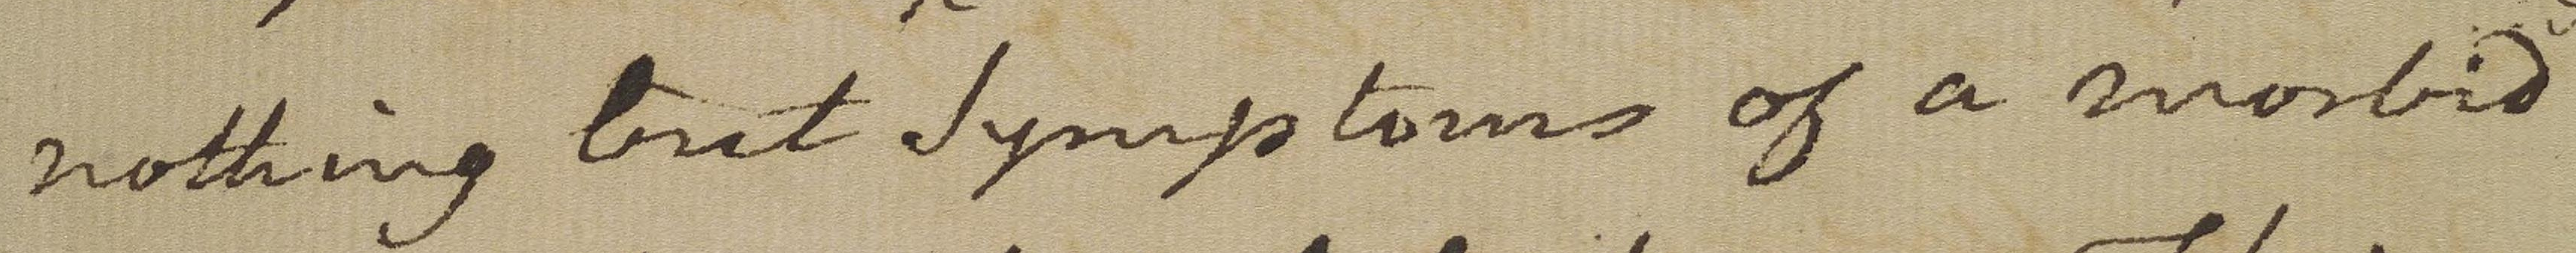nothing but symptoms of a morbid
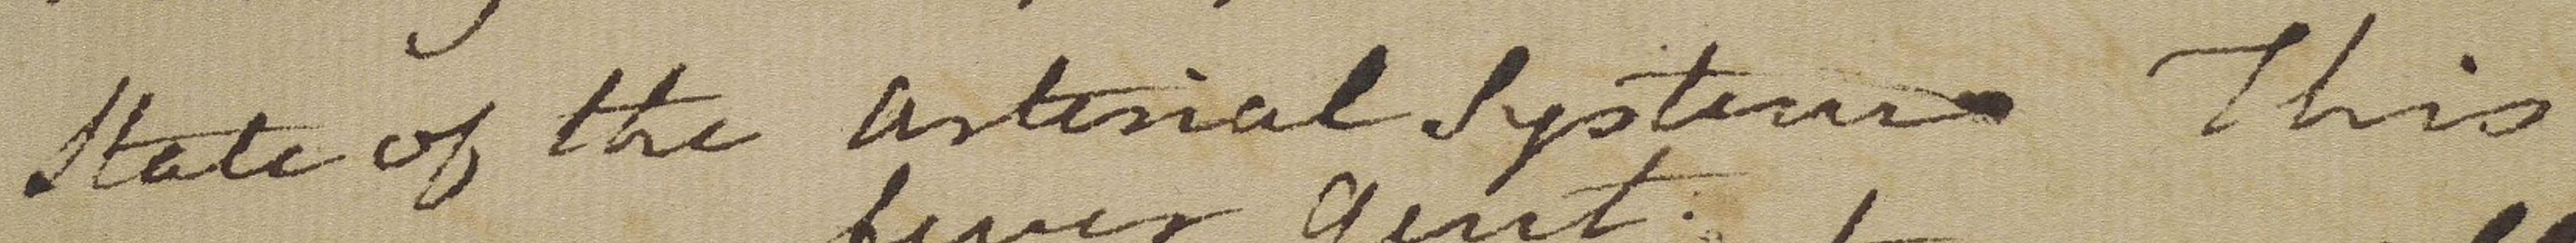state of the aterial system. This
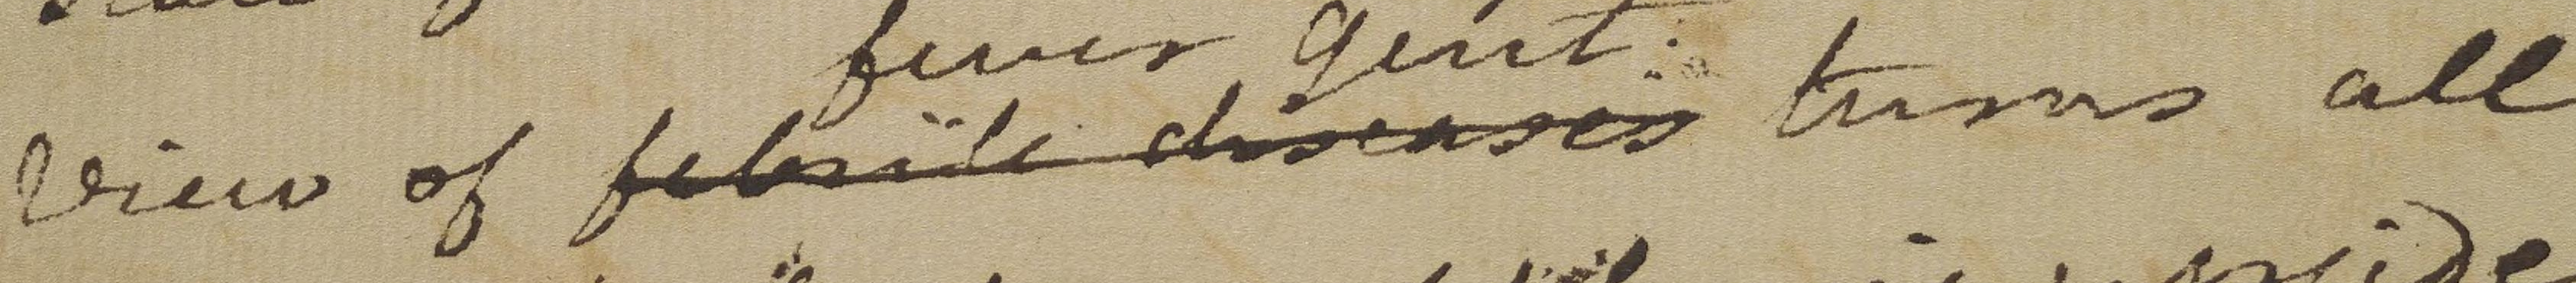view of [febrile diseases] turns all
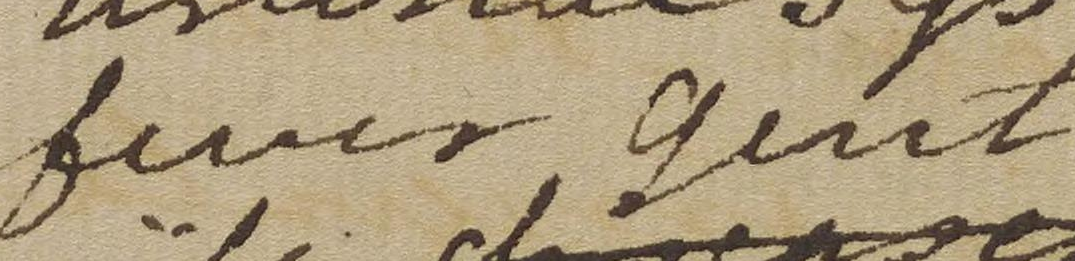fever gent.
